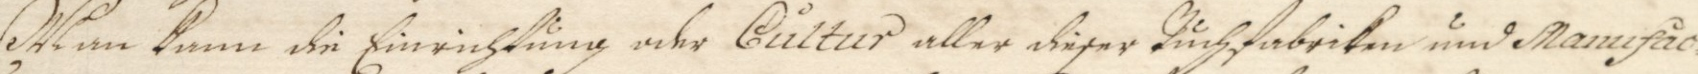Man kann die Einrichtung oder Cultur aller dieser Tuchfabriken und Manufac-
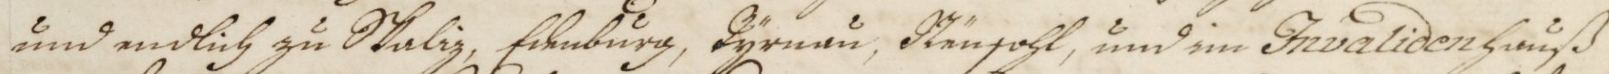und endlich zu Skaliz, Edenburg, Tyrnau, Neüsohl, und im Invalidenhauß
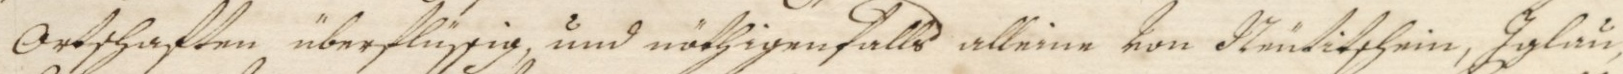Ortschaften überflüssig und nöthigenfalls alleine von Neütitschein, Iglau,
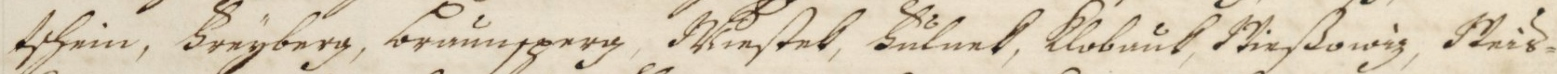tschein, Freyberg, Braunsperg, Miestek, Fulnek, Klobauk, Wießowiz, Weis-
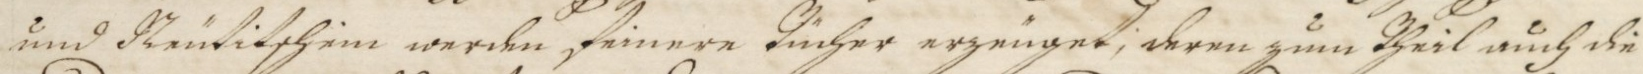und Neütitschein werden feinere Tücher erzeüget, deren zum Theil auch die
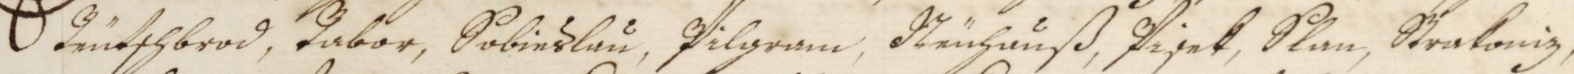Teütschbrod, Tabor, Sobieslau, Pilgram, Neühauß, Pisek, Slan, Strakoniz,
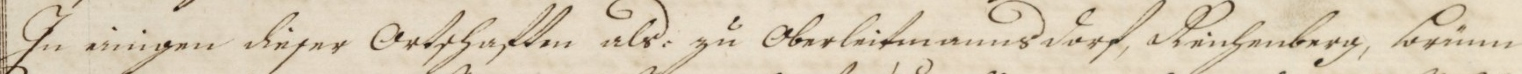In einigen dieser Ortschaften als: zu Oberleitmannsdorf, Reichenberg, Brünn
